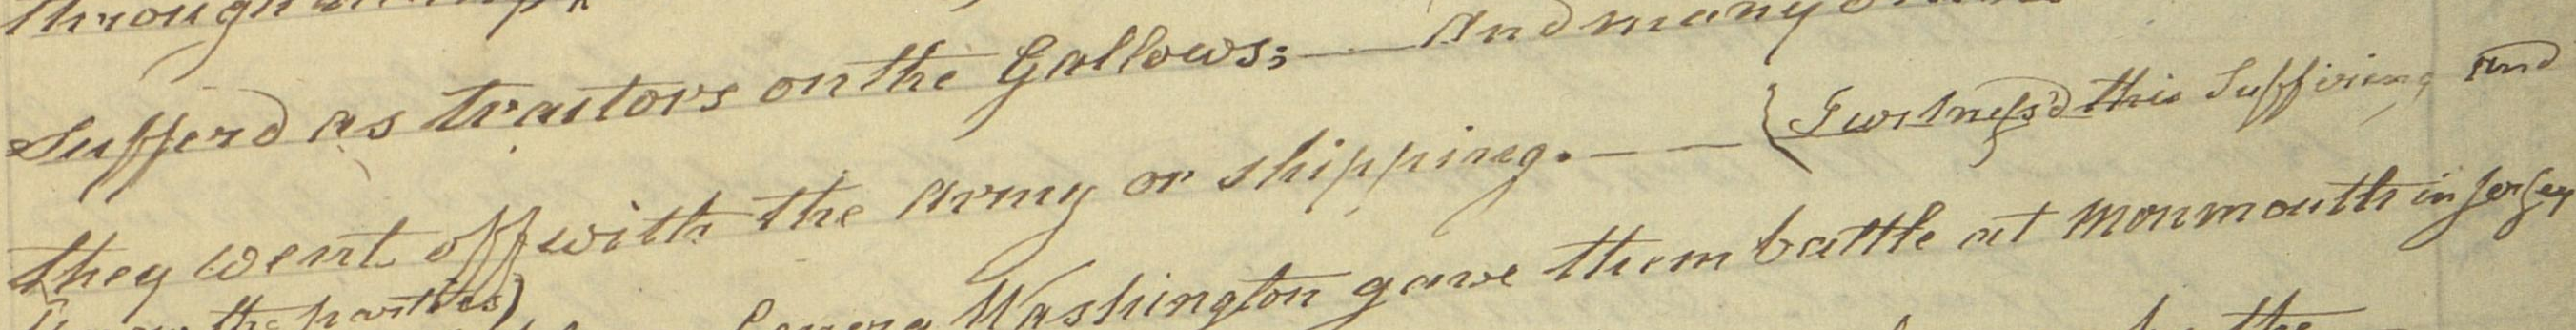they went off with the Army or shipping. (I witnessd this Suffering and
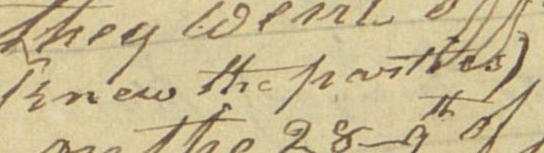knew the parties)
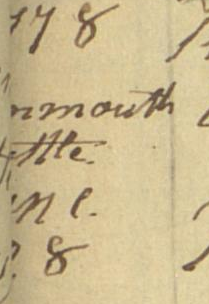-nmouth
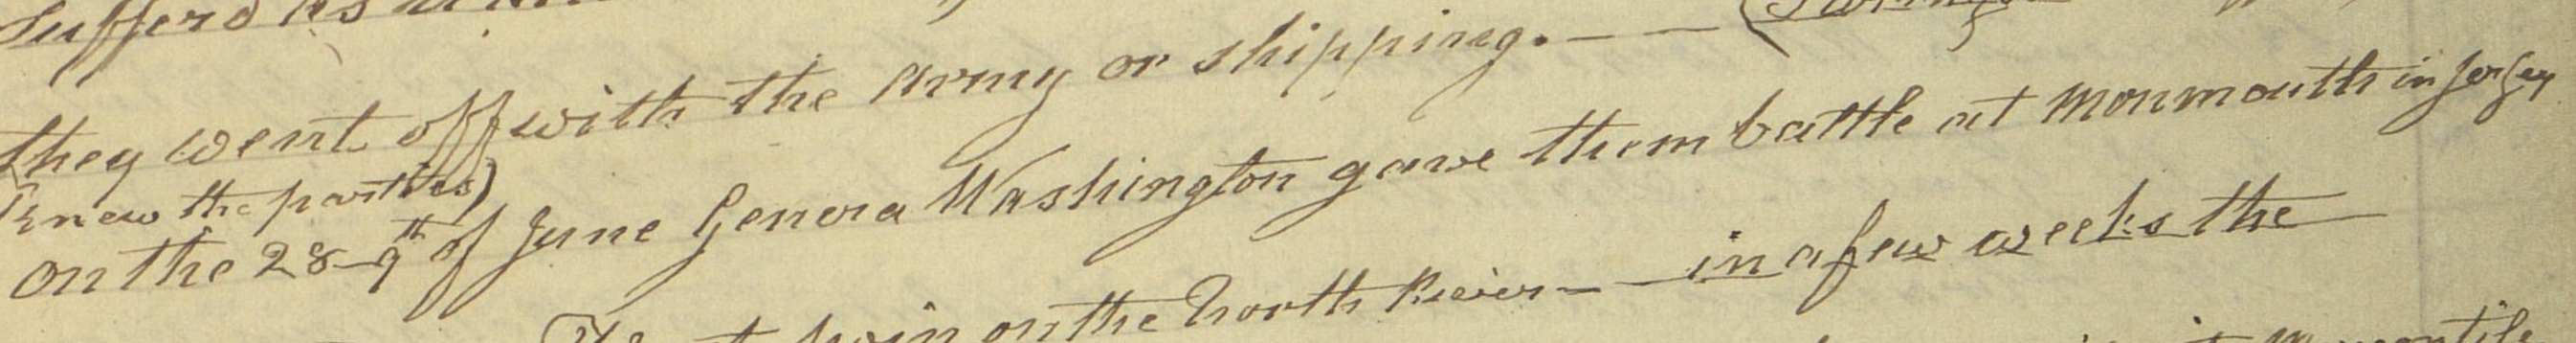on the 28-9^th of June Genera Washington gave them battle at Monmouth in Jersey
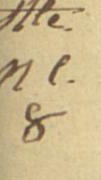8
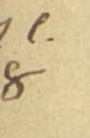8
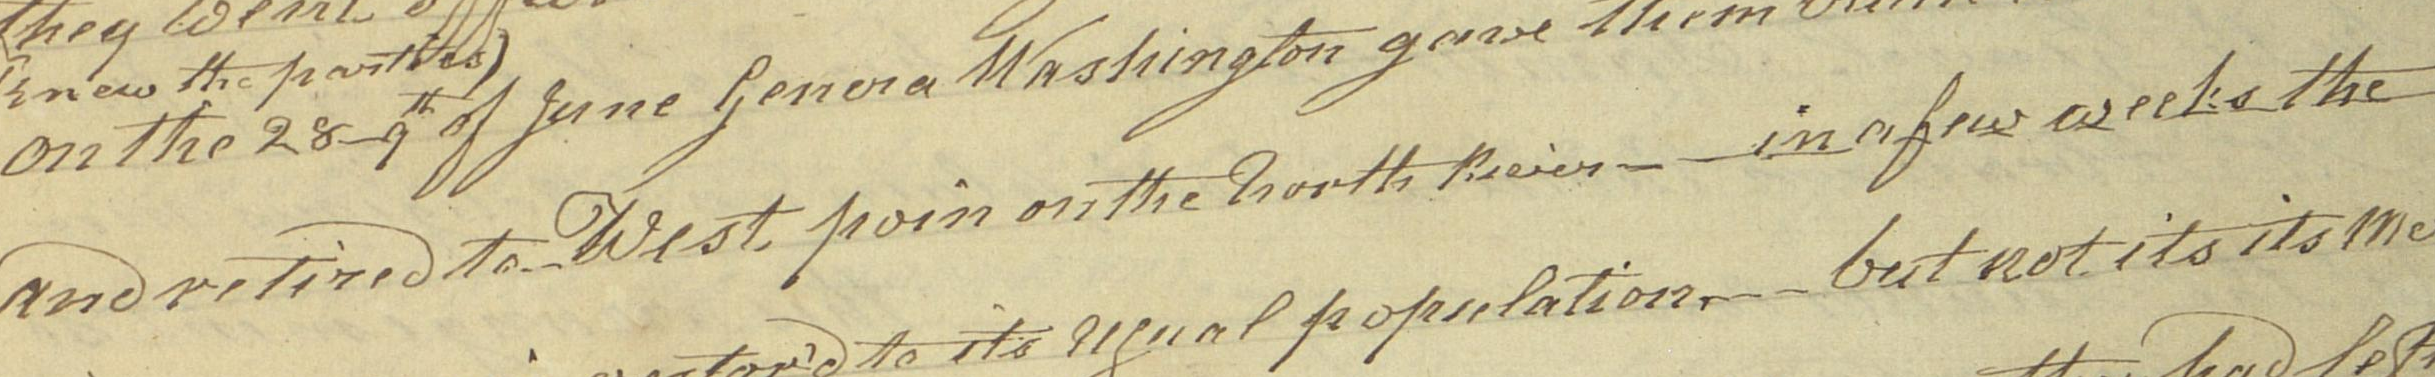and retired to West poin on the North River. in a few weeks the
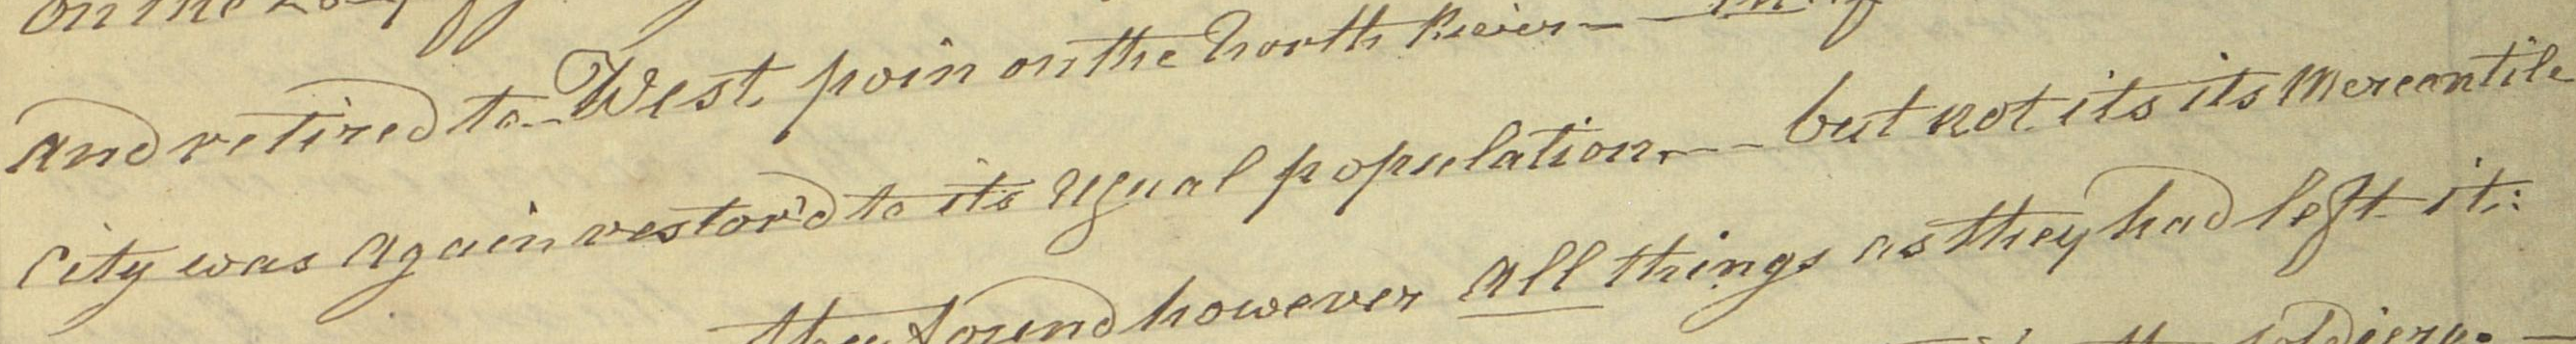City was again restor'd to its Usual population, but not its its Mercantile
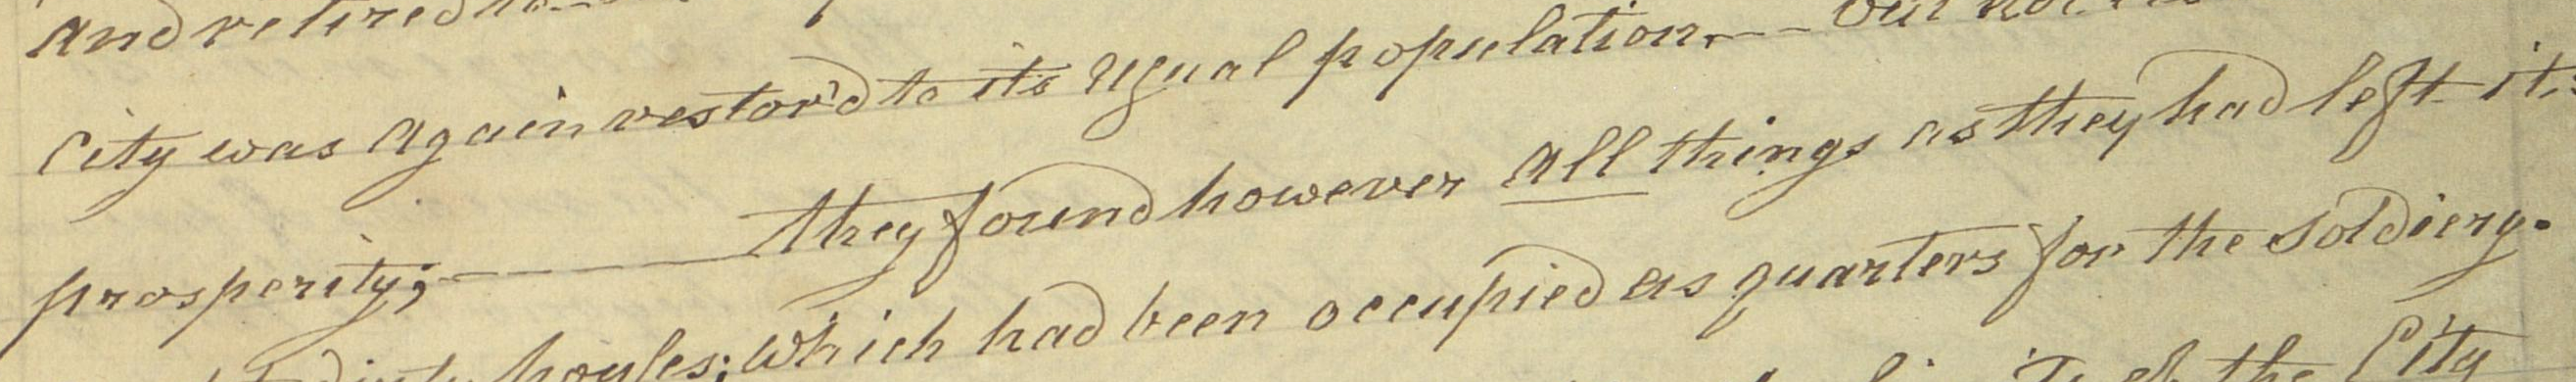prosperity; they found however all things as they head left it:
